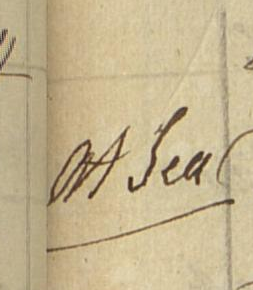At Sea
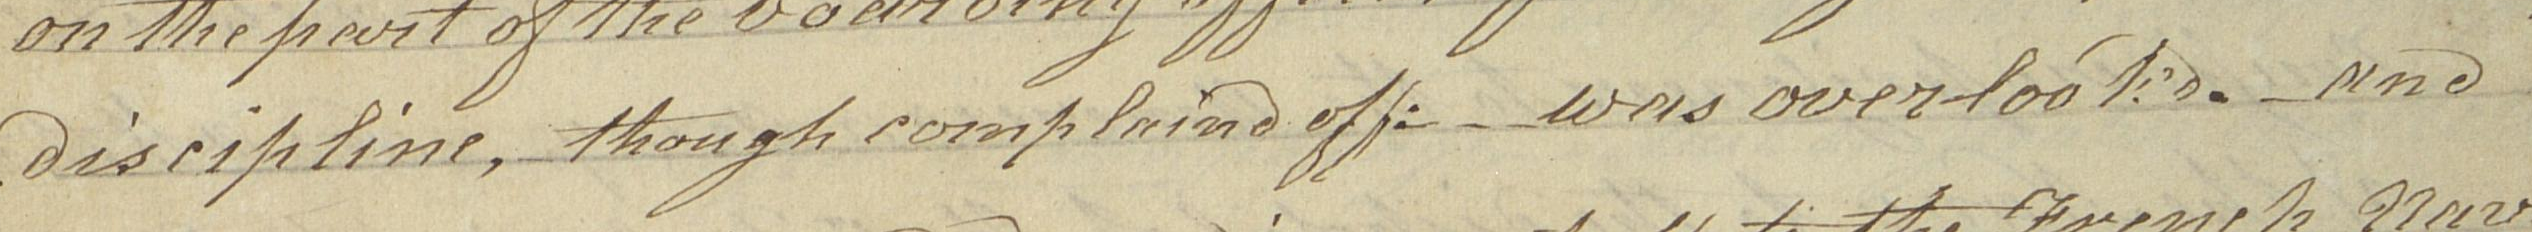discipline, though complaind off: was overlookd. And
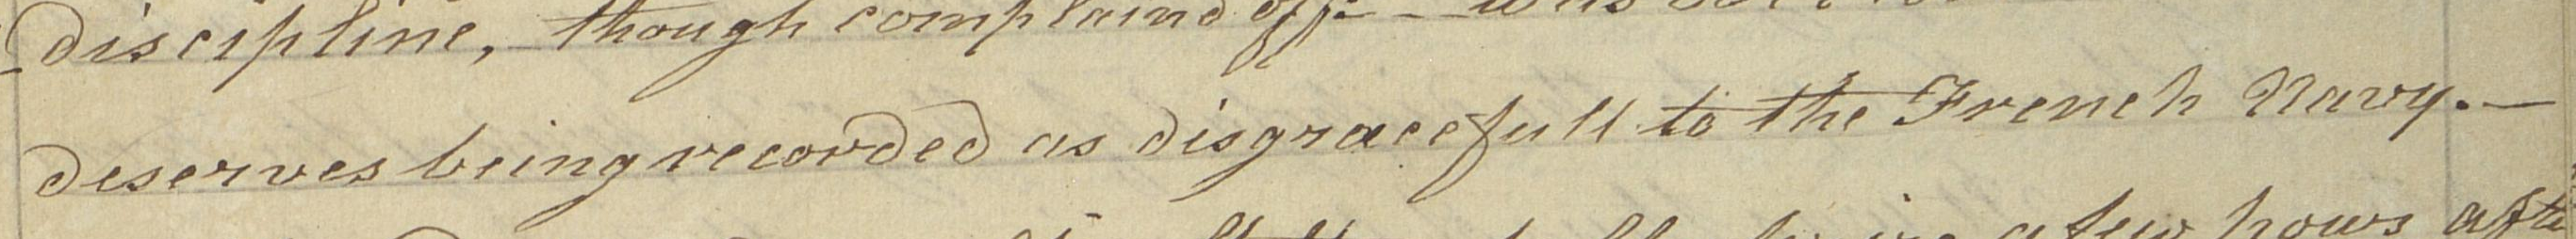deserves being recorded as disgraceful to the French Navy.
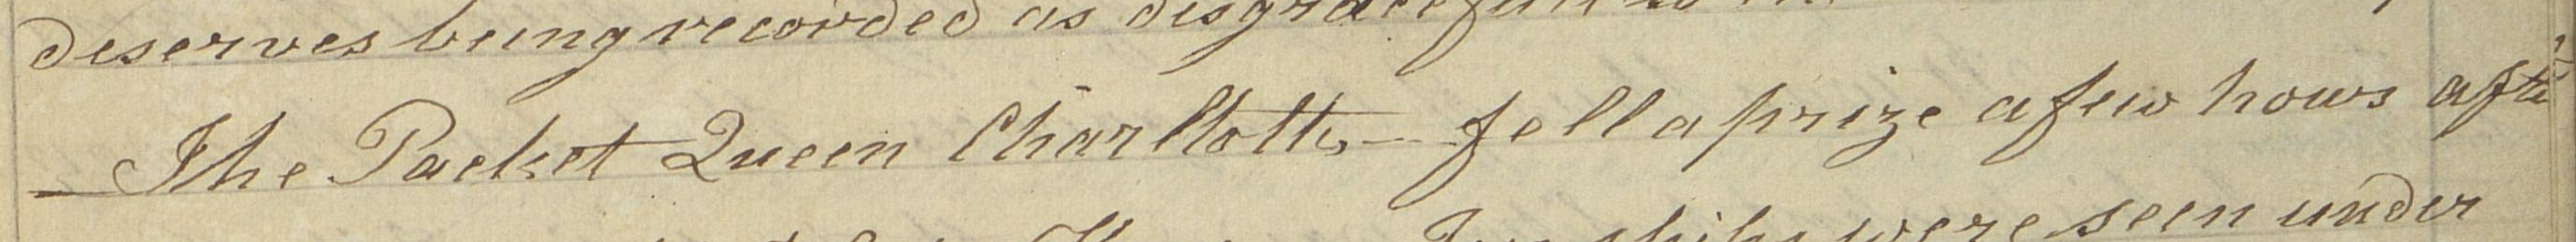The Packet Queen Charlotte, fell a prize a few hours after
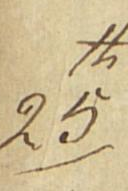25^th
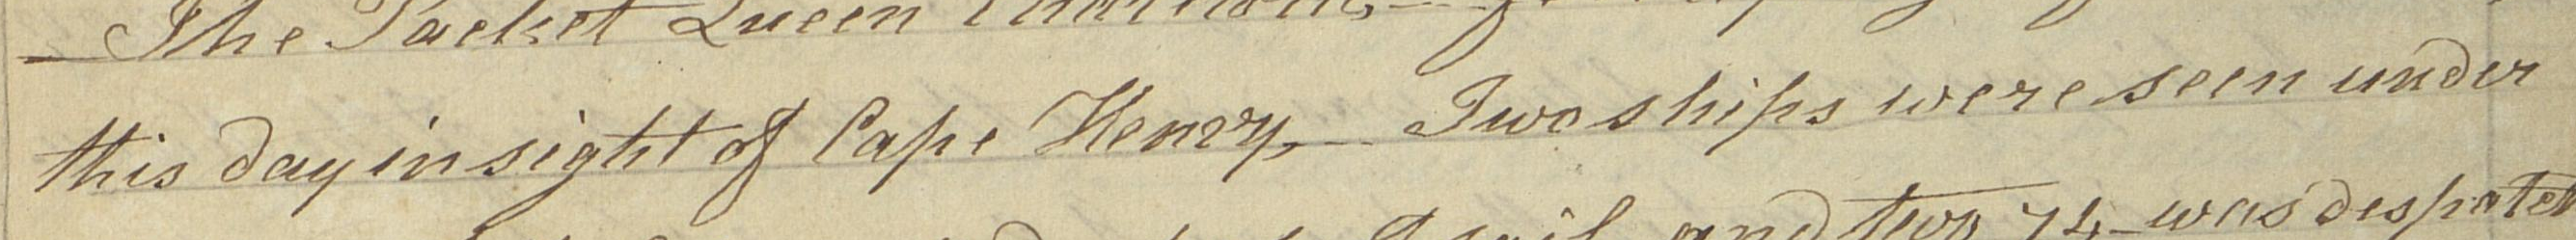this day in sight of Cape Henry. Two ships were seen under
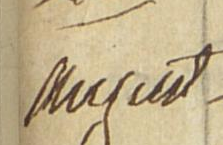August
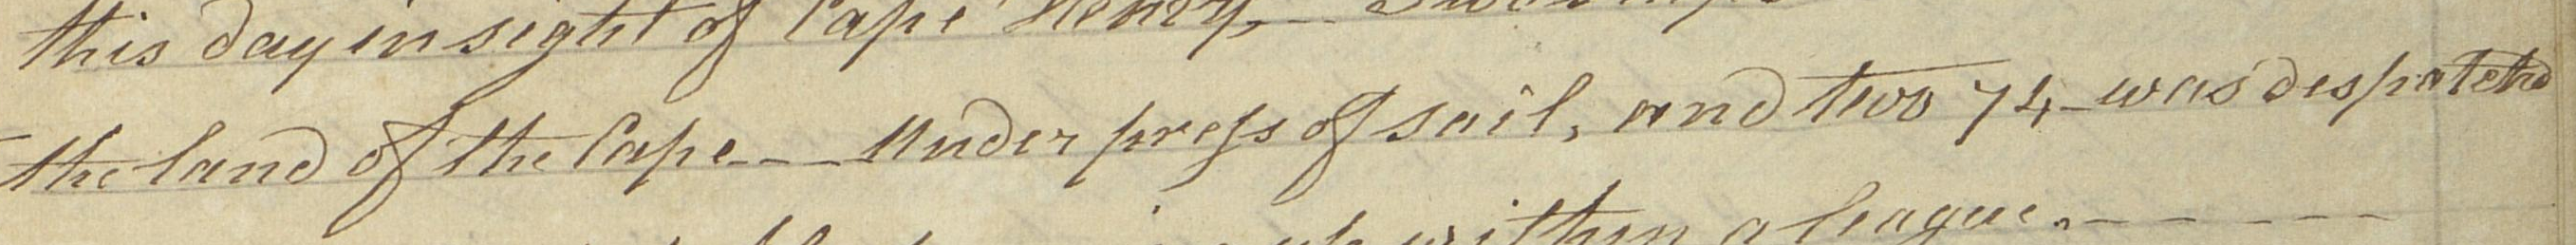the land of the Cape. Under press of sail, and two 74, was dispatchd
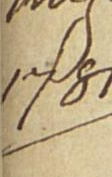1781
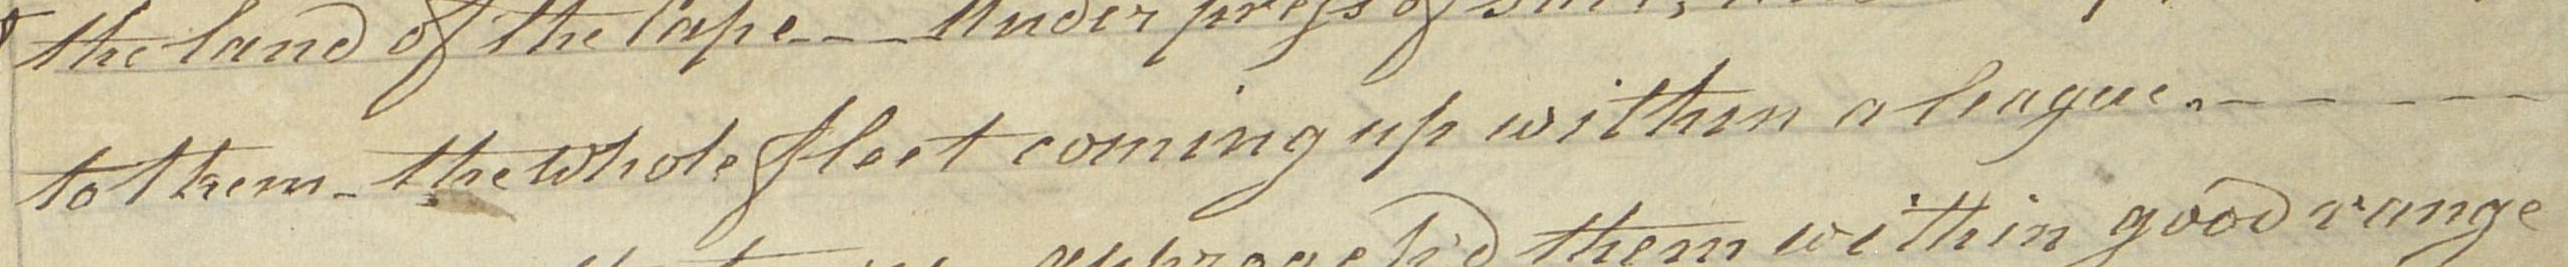to them. the whole fleet coming up within a league.
